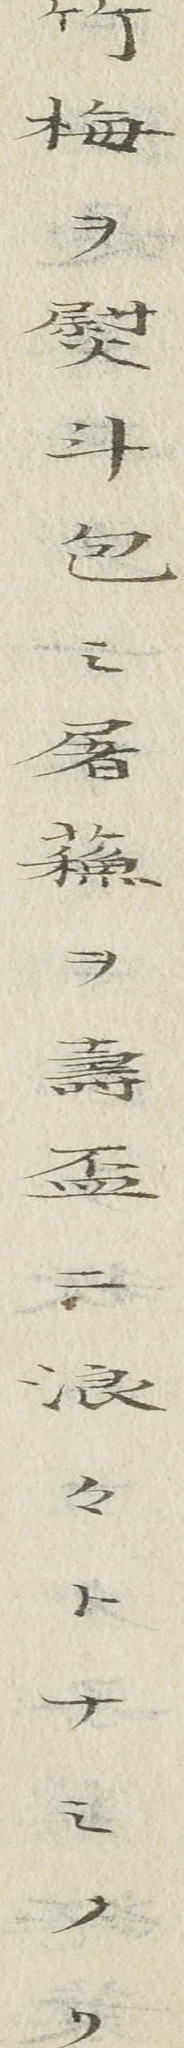竹梅ヲ熨斗包ミ屠蘇ヲ寿盃ニ浪々トナミノリ
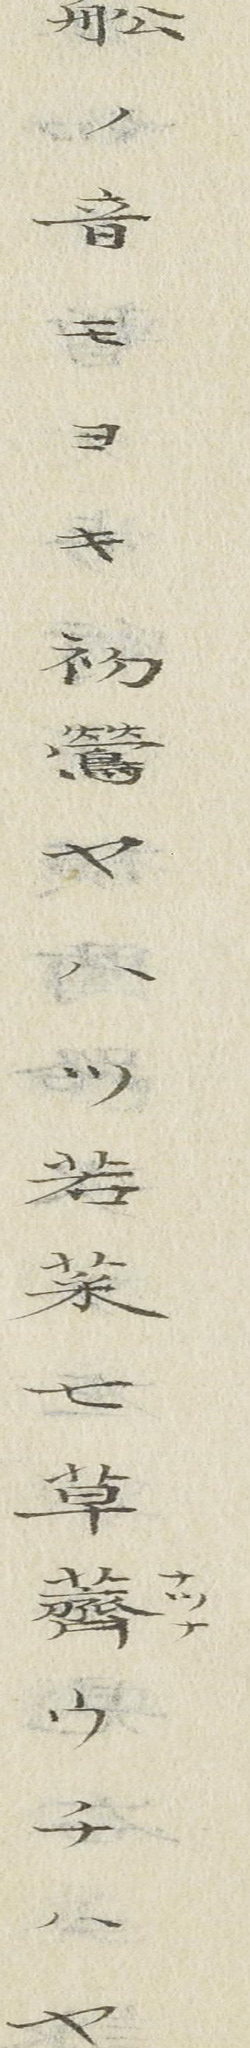船ノ音モヨキ初鶯ヤハツ若菜七草薺ウチハヤ
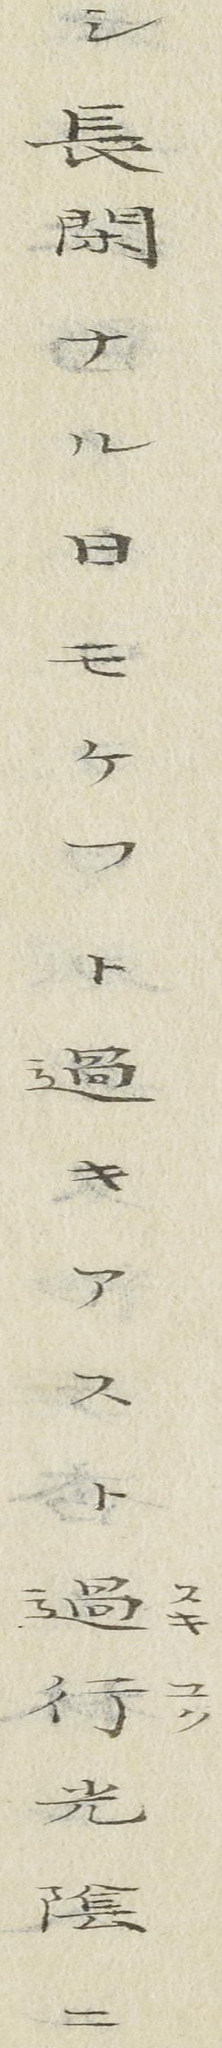シ長閑ナル日モケフト過キアスト過行光陰ニ
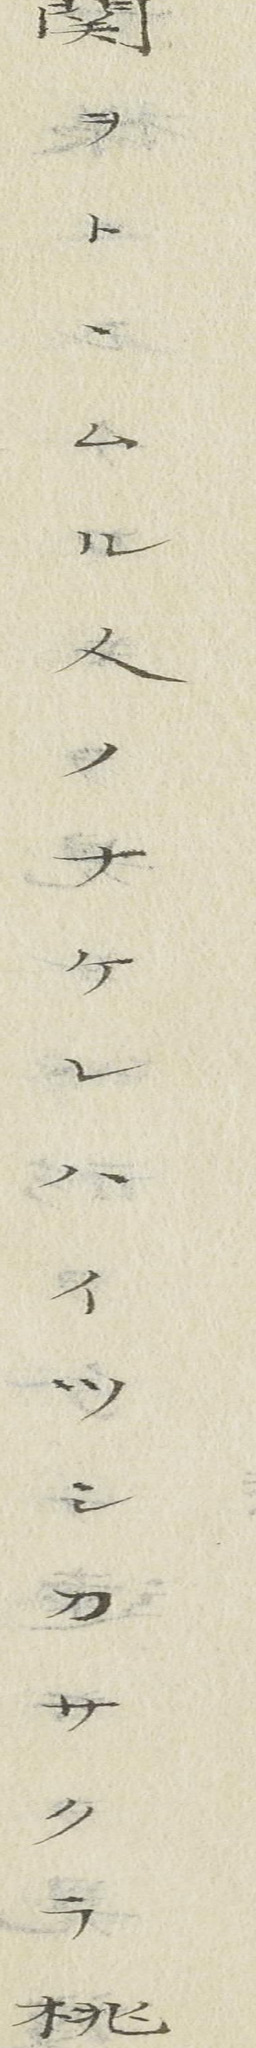関ヲトヽムル人ノナケレハイツシカサクラ桃
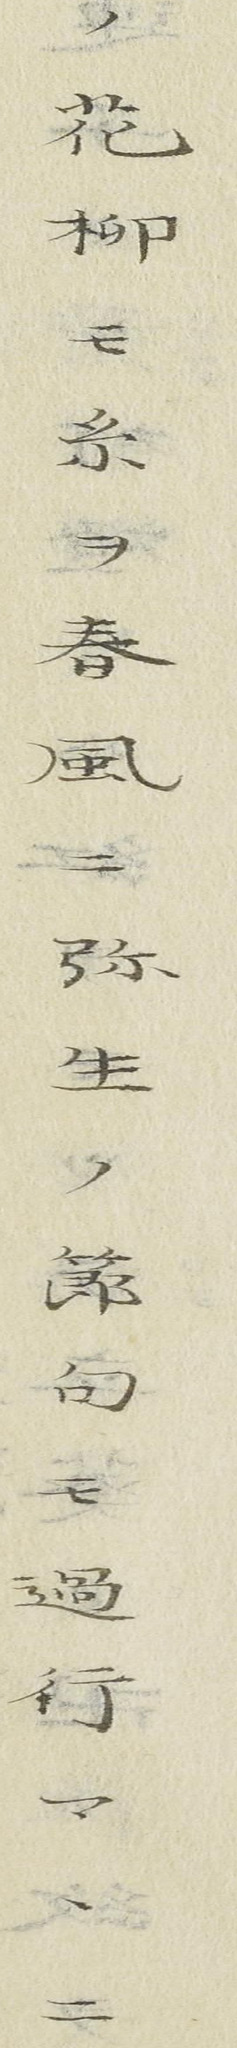ノ花柳モ糸ヲ春風ニ弥生ノ節句モ過行マヽニ
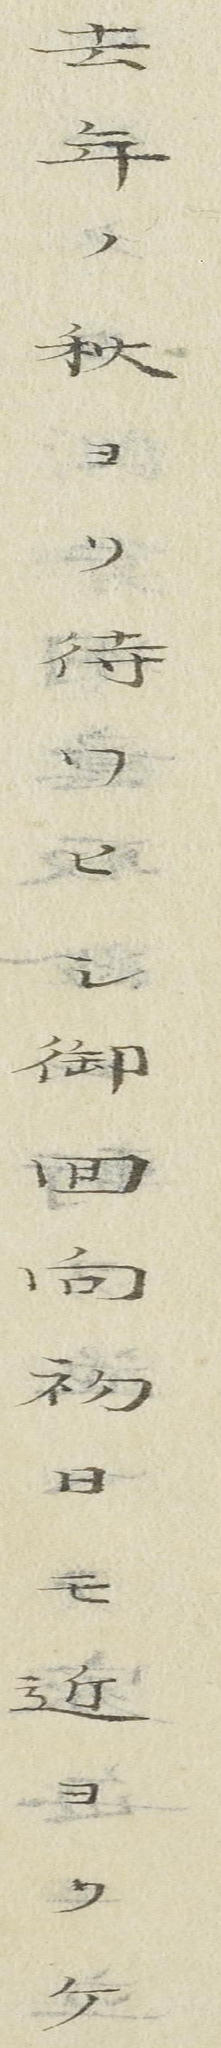去年ノ秋ヨリ待ワヒシ御回向初日モ近ヨリケ

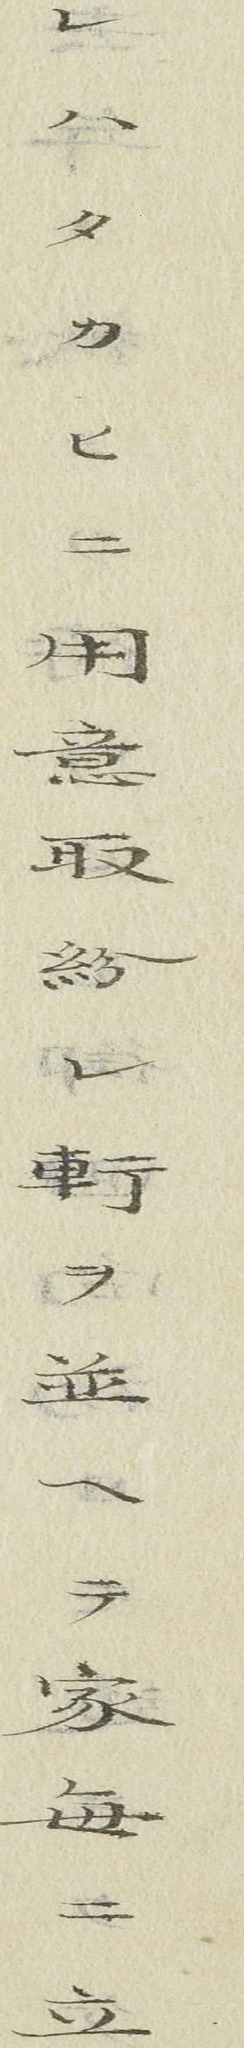レハタカヒニ用意取紛レ軒ヲ並ヘテ家毎ニ立
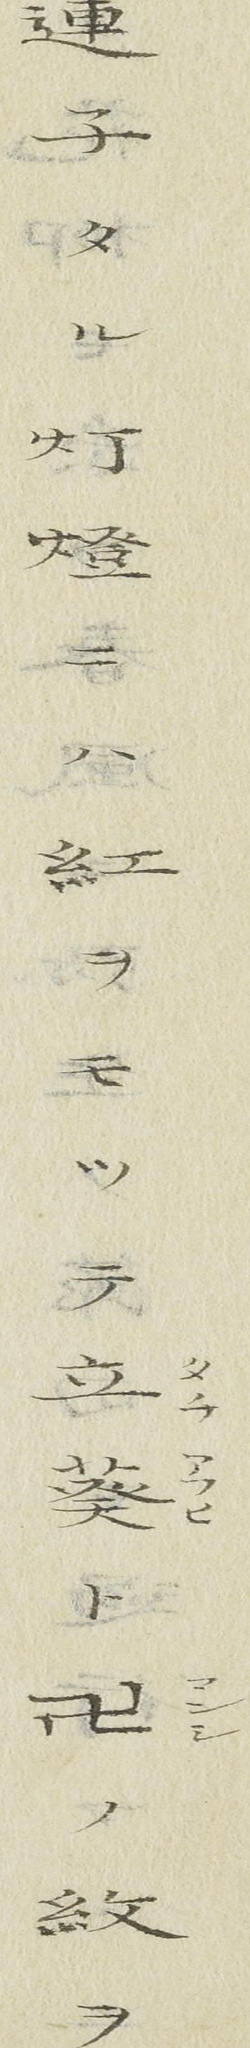連子タル灯燈ニハ紅ヲモツテ立葵ト卍ノ紋ヲ
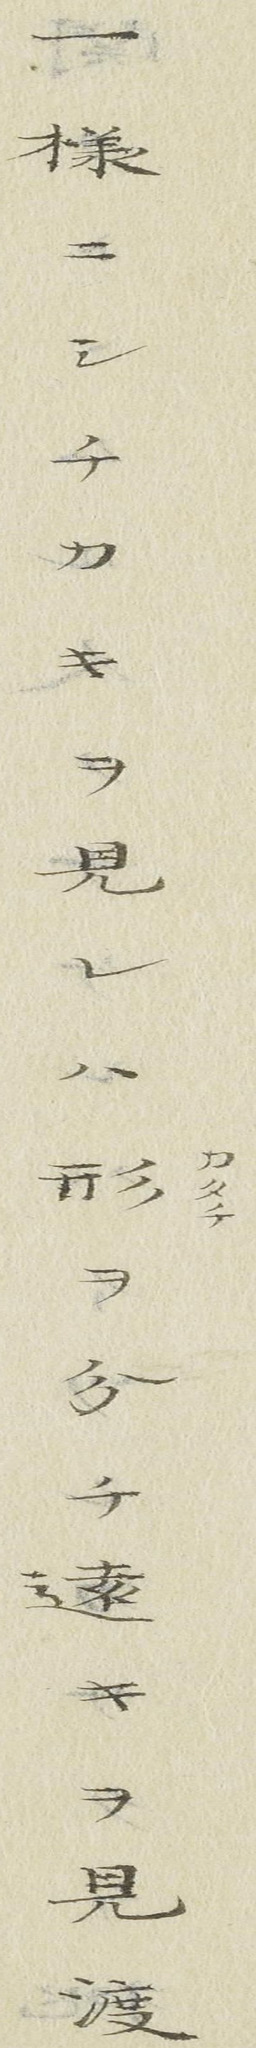一様ニシチカキヲ見レハ形ヲ分チ遠キヲ見渡
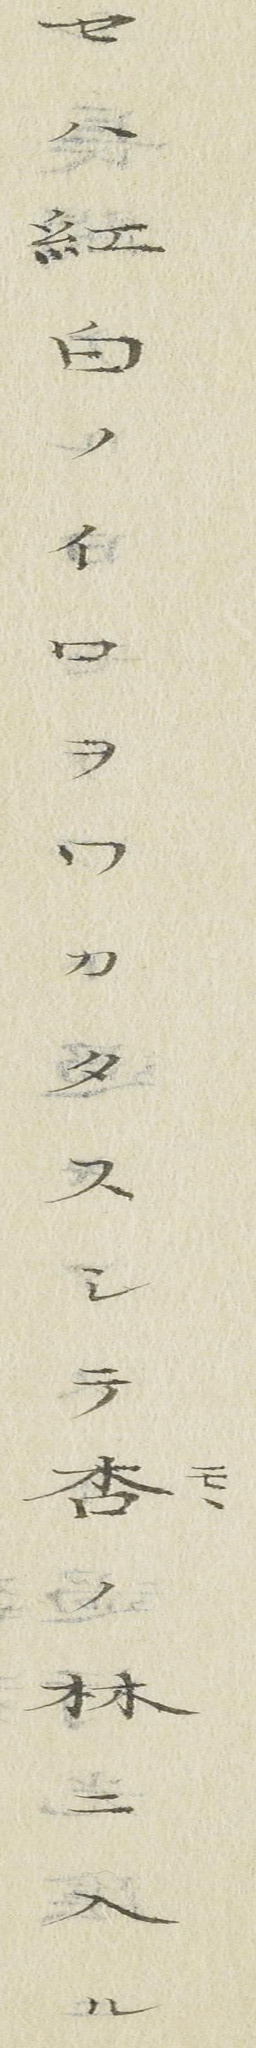セハ紅白ノイロヲワカタスシテ杏ノ林ニ入ル
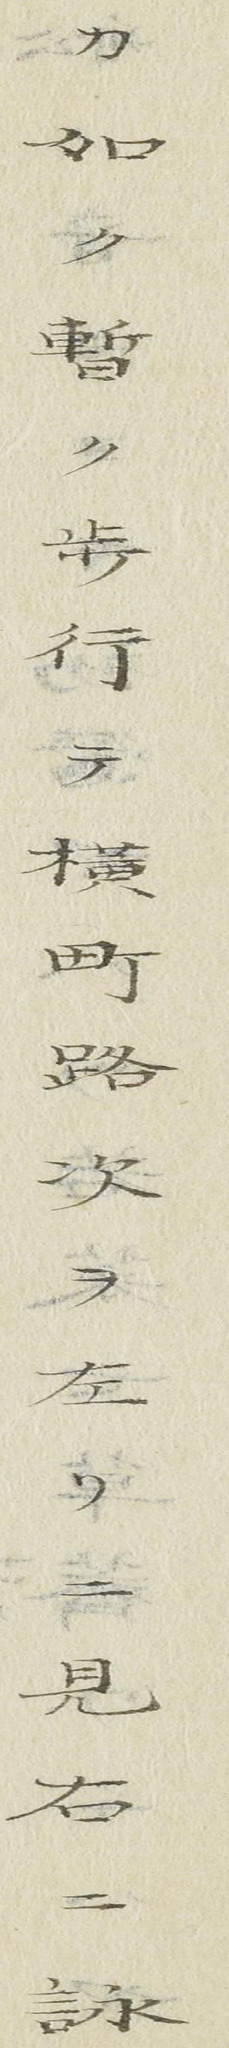カ如ク暫ク歩行テ横町路次ヲ左リニ見右ニ詠
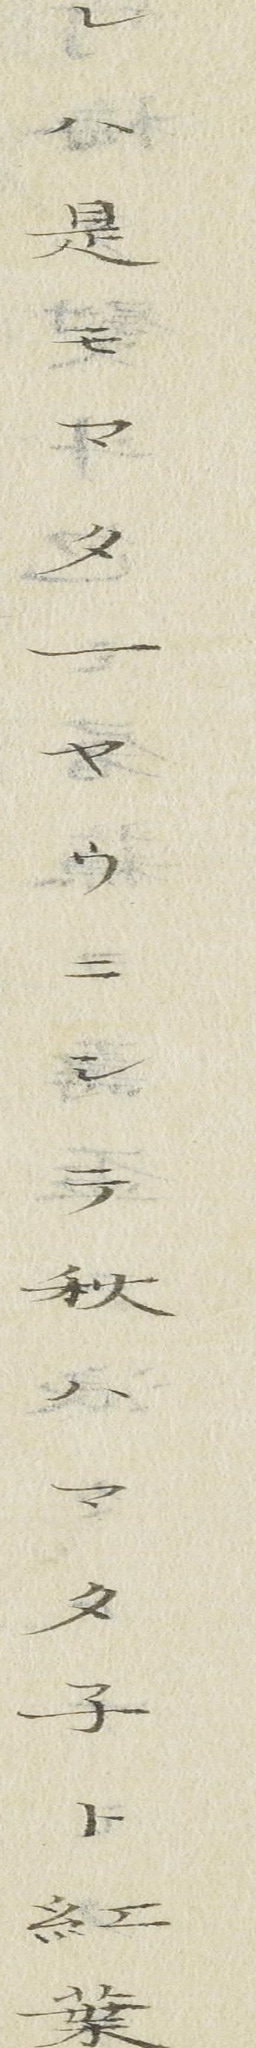レハ是モマタ一ヤウニシテ秋ハマタ子ト紅葉
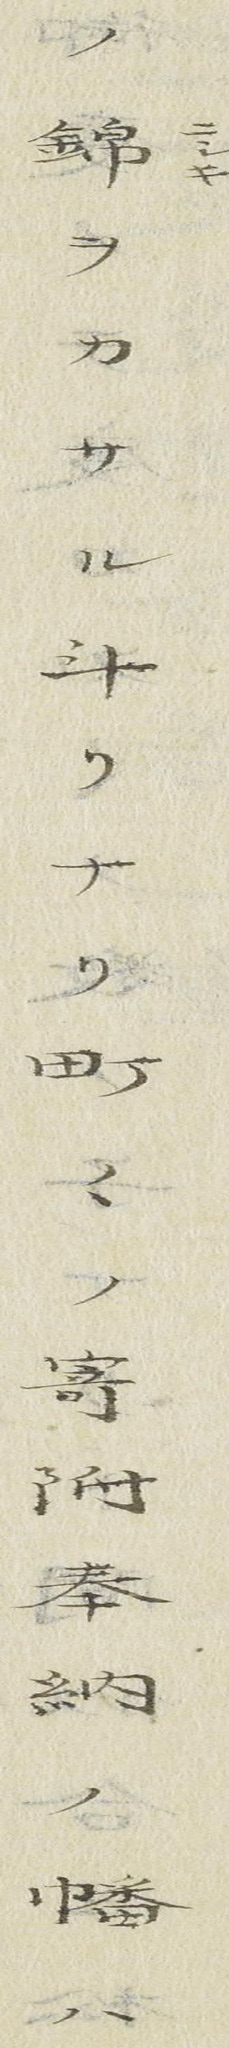ノ錦ヲカサル斗リナリ町〱ノ寄付奉納ノ幡ハ
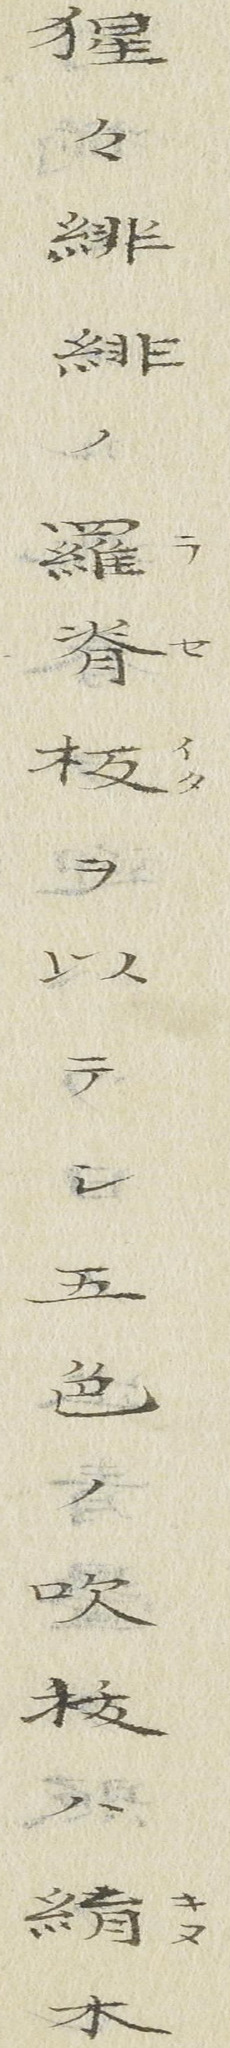猩々緋緋ノ羅脊板ヲ以テシ五色ノ吹抜ハ絹木
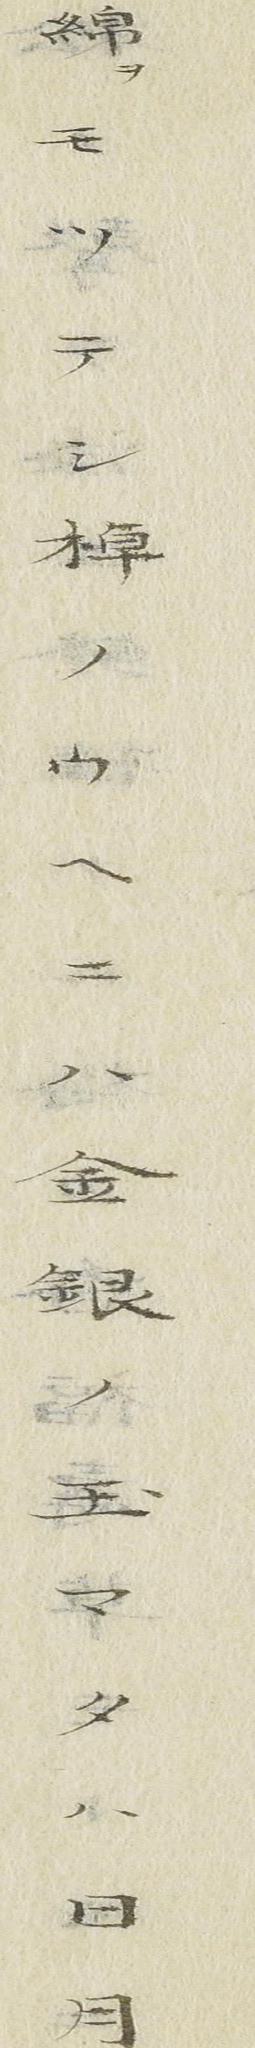綿ヲモツテシ棹ノウヘニハ金銀ノ玉マタハ日月
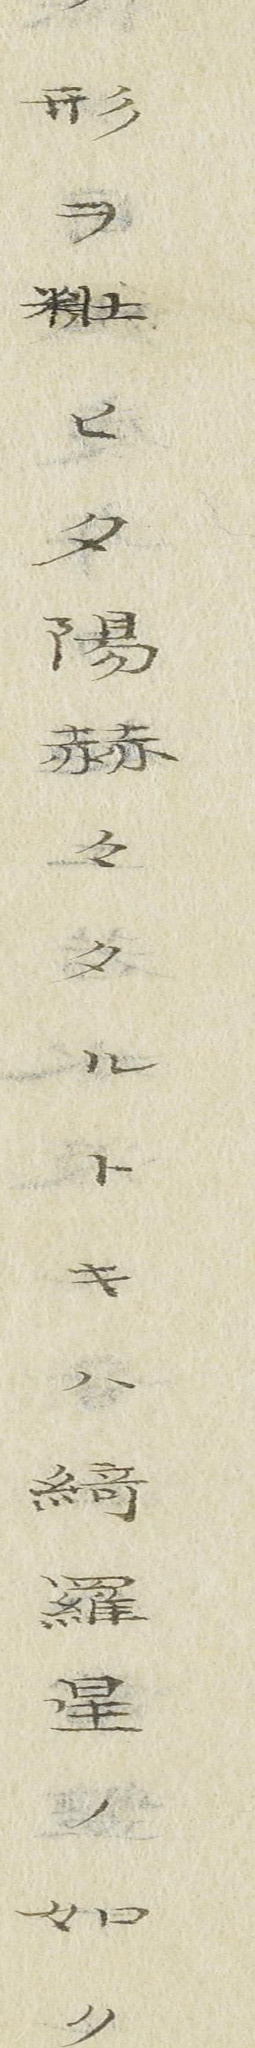ノ形ヲ糚ヒタ陽赫々タルトキハ綺羅星ノ如ク
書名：地災撮要　地震之部　巻ノ二
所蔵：東京大学地震研究所図書室 Earthquake Research Institute Library, The University of Tokyo, JAPAN
